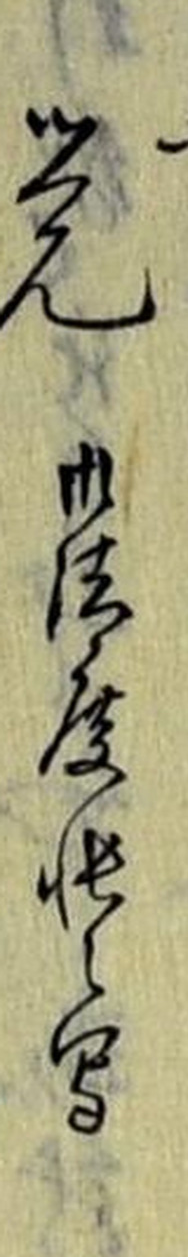覚御法度帳之写
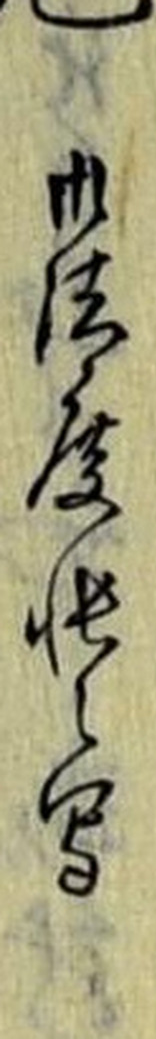覚御法度帳之写
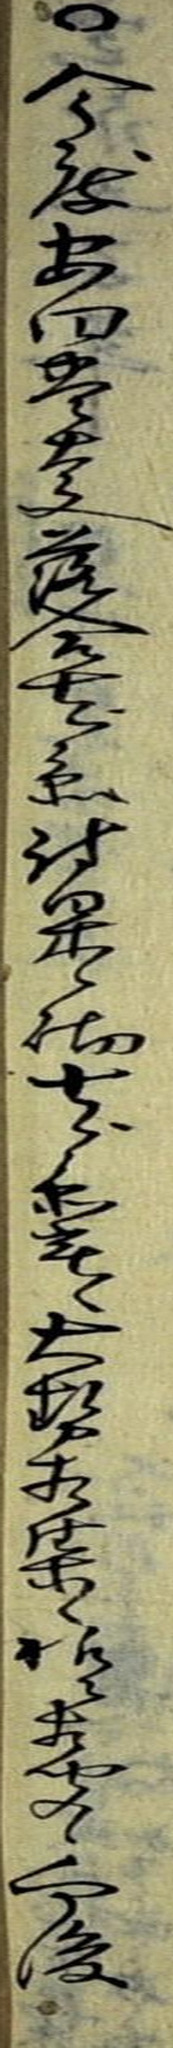〇今度安田豊大夫落合七郎兵衛討果候砌七郎兵衛宅へ大勢相集候様ニ相聞候向後
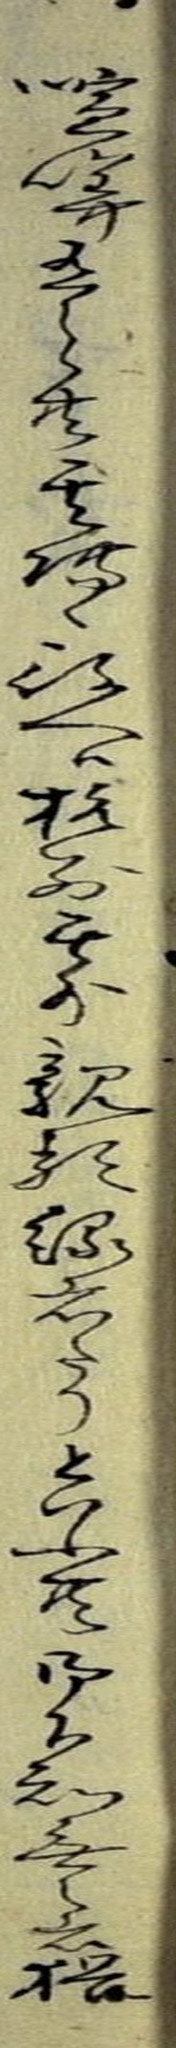喧嘩有之共其場へ役人ハ格別其外親類縁者たりといふ共御下知無之者猥
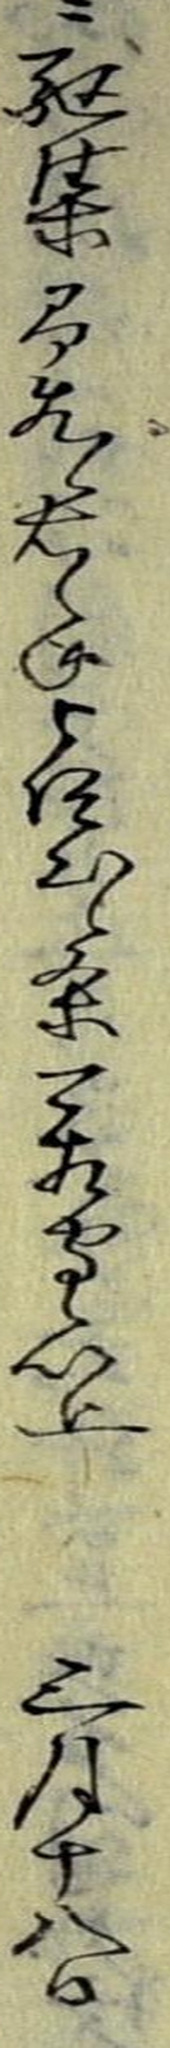ニ駆集間敷候右之趣被仰出候条可相守候以上三月十八日
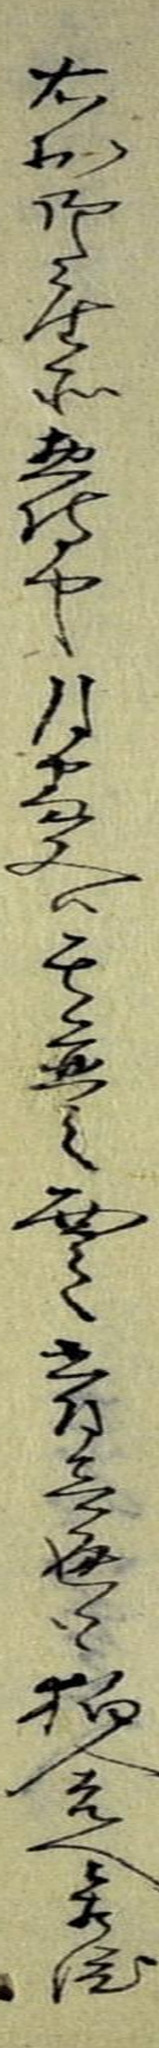右於御座所惣侍中月番又ハ其並之面々へ書付壱通ツヽ狛舎人被相渡
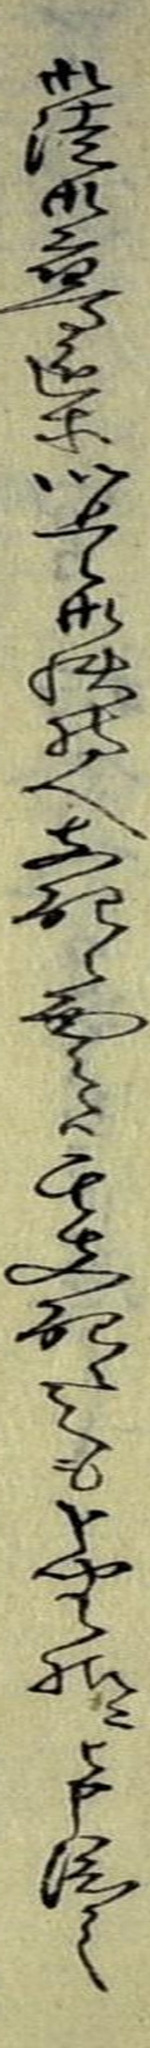御徒御鷹匠等以上之御扶持人支配之面々ヘハ其支配々々へも申聞候様ニ被申渡之
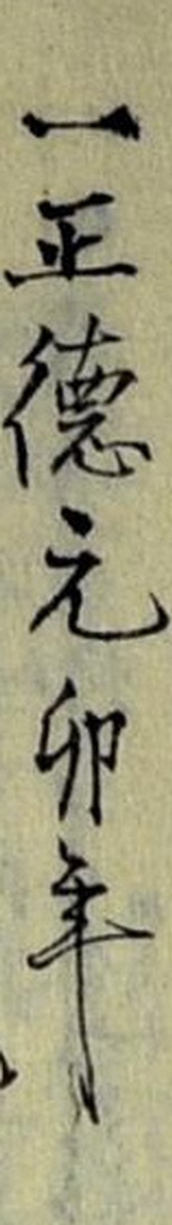一正徳元卯年
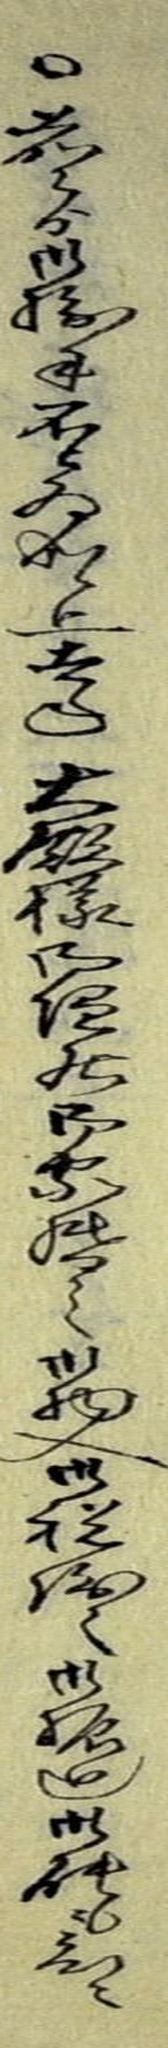〇前々ゟ御勝手不被為成候上去年大殿様御隠居御家督之御物入御祝儀之御振廻御能も度々
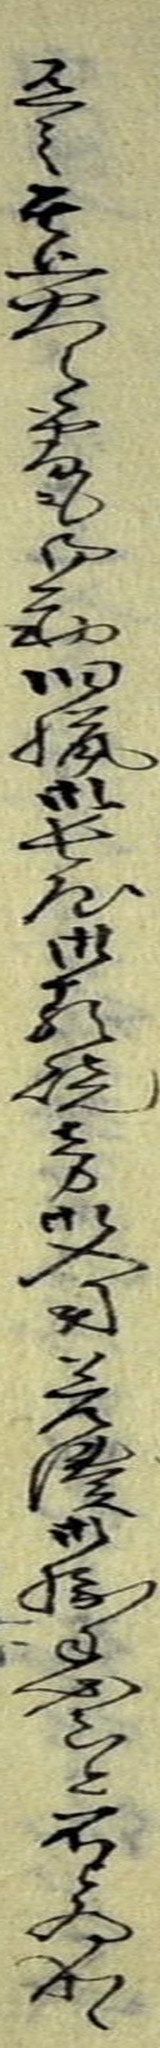有之其上火之御番も御勤旧臘御長屋御類焼旁御入用差湊御勝手必至と不被為成候
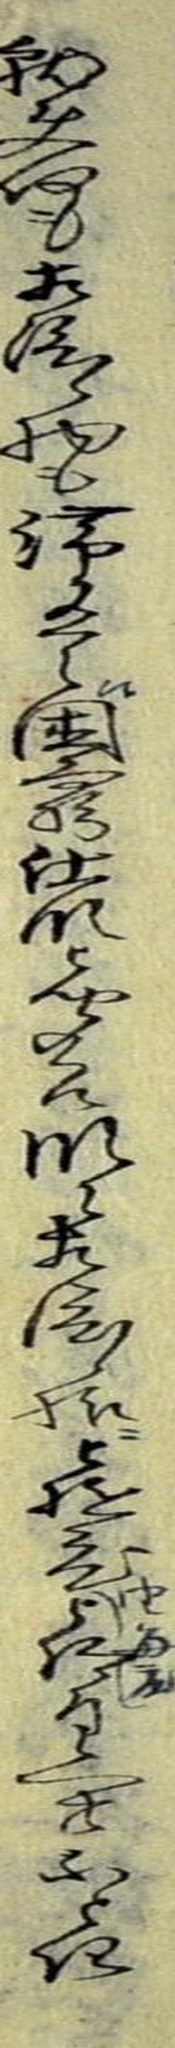就夫何も相渡候物も締有之候困窮仕段被聞召段々相渡候様ニ被遊度由毎度被仰付候へ共不被任
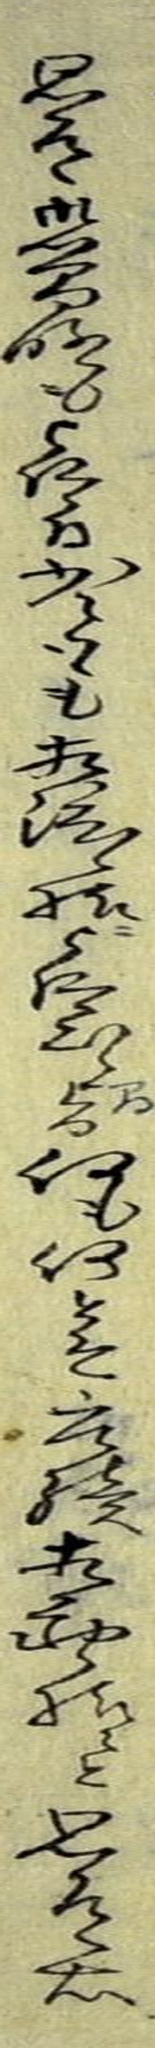思召候御簡略も被仰付少々ツヽも相渡候様ニ被仰出候旨何も何とそ取続相勤候様ニと思召候右
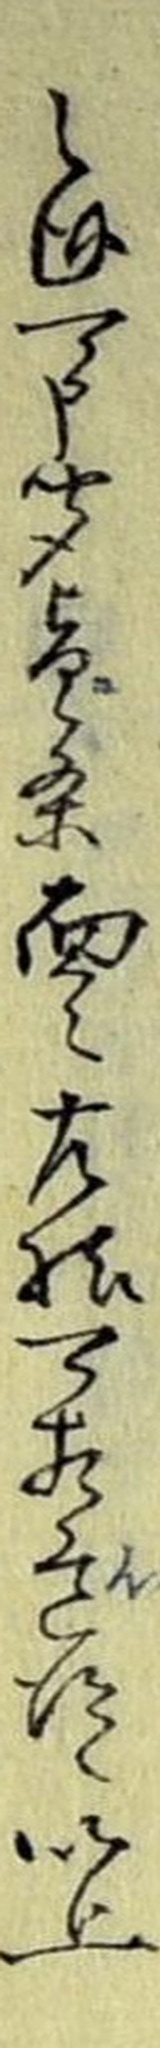之趣可申聞旨之条面々左様可相意得候以上
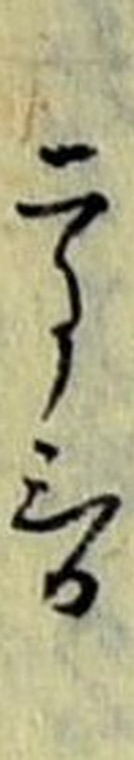二月三日

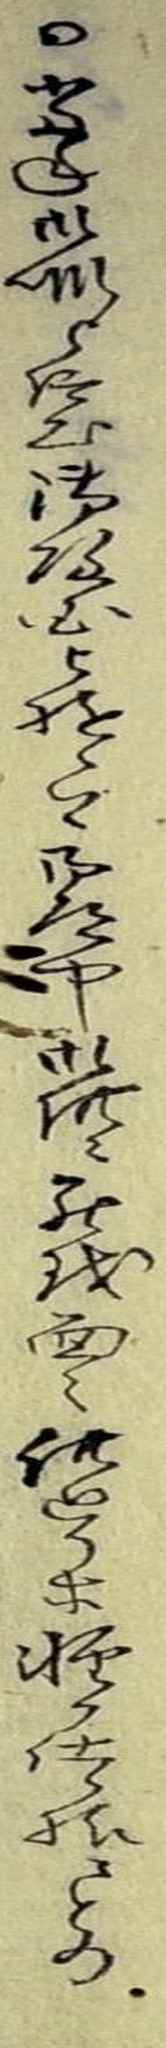〇当年御暇被仰出御帰国被遊候ハヽ御道中御供ニ罷越面々供廻り等軽ク仕候様ニとの
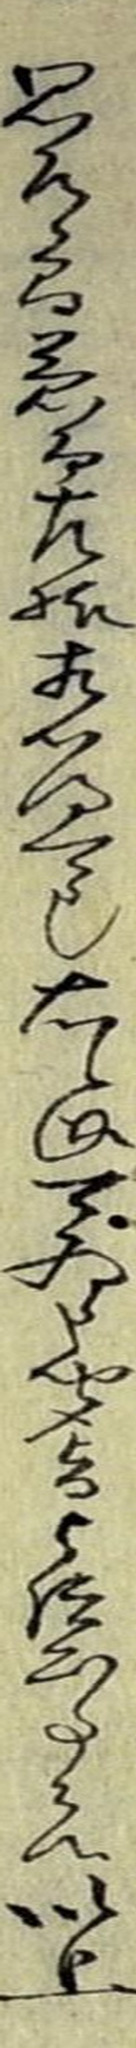思召候間兼而左様相心得可申候右之趣可為申聞旨被仰出事ニ候以上
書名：命令之部 一
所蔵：福井県文書館 Fukui Prefectural Archives
